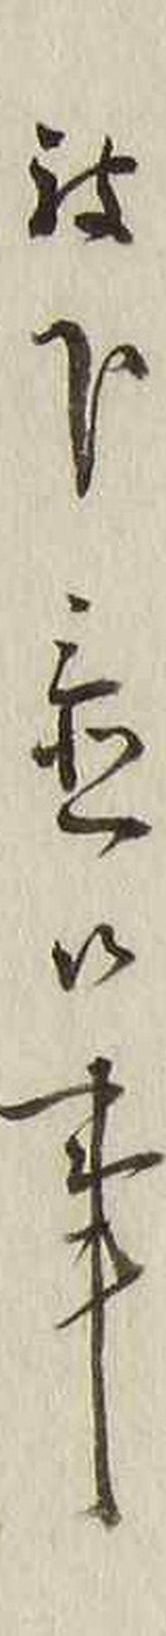被下置候事
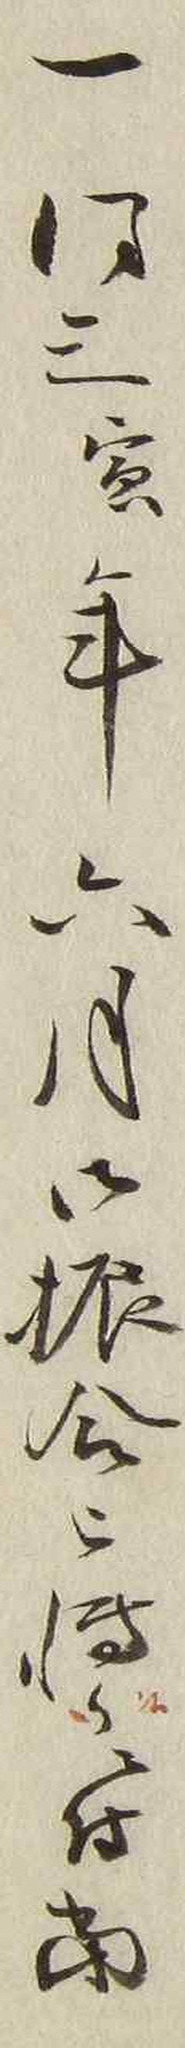一同三寅年六月御振合被転候ニ付当

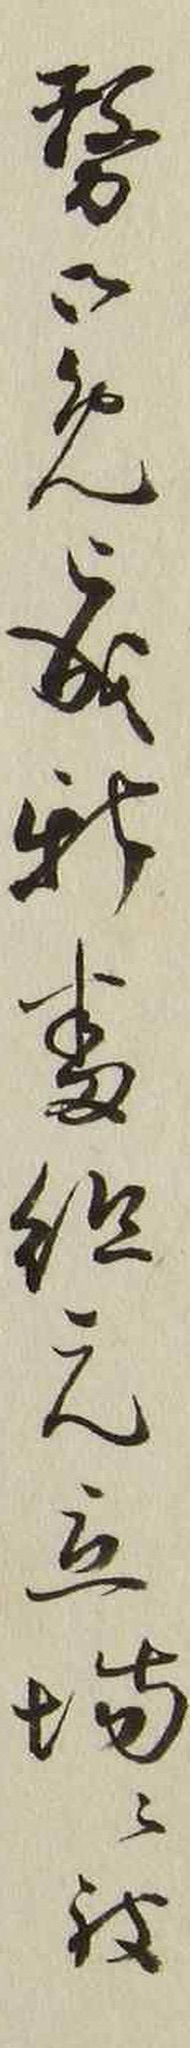務御免被成新番組元立場ニ被
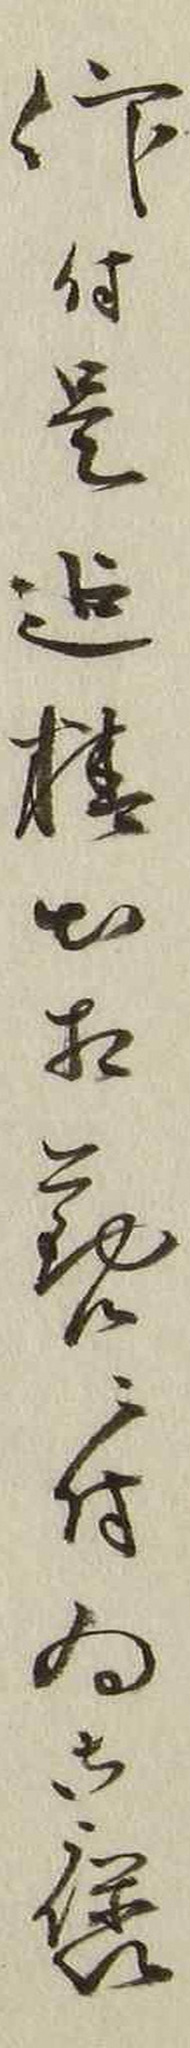仰付是迄精出相勤候ニ付為御褒
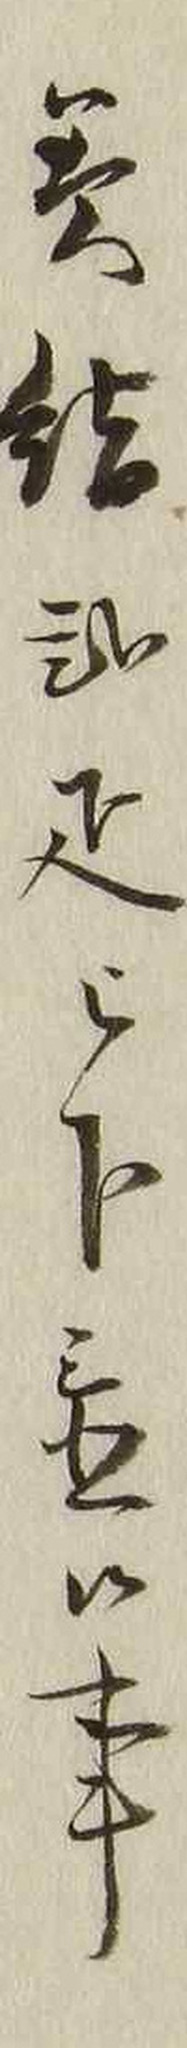美絹弐疋被下置候事
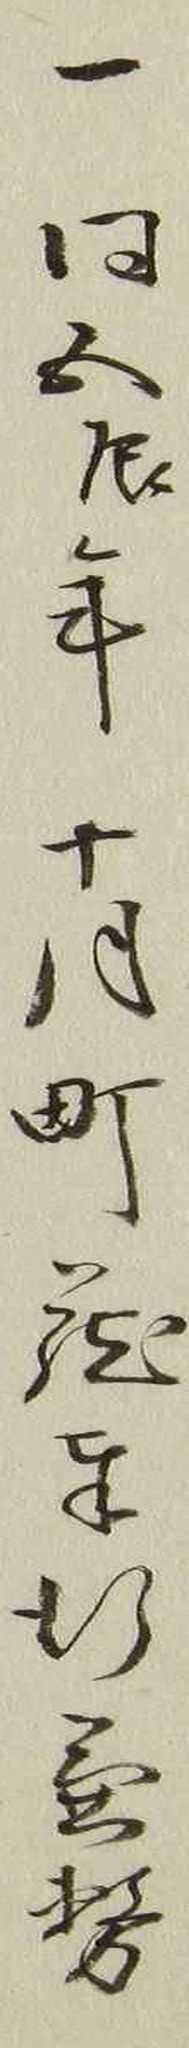一同五辰年十月町蔵奉行兼務
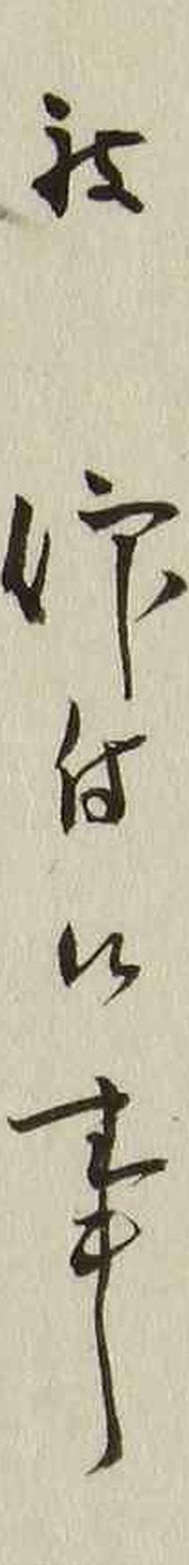被仰付候事
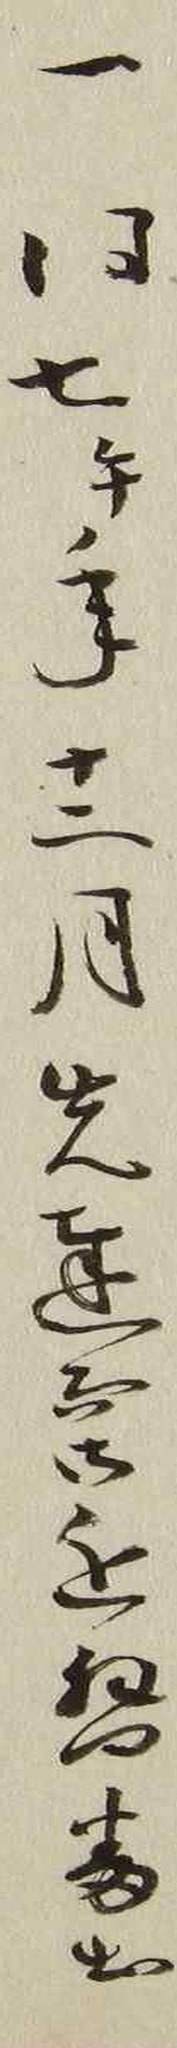一同七午年十二月先達而御近習番出
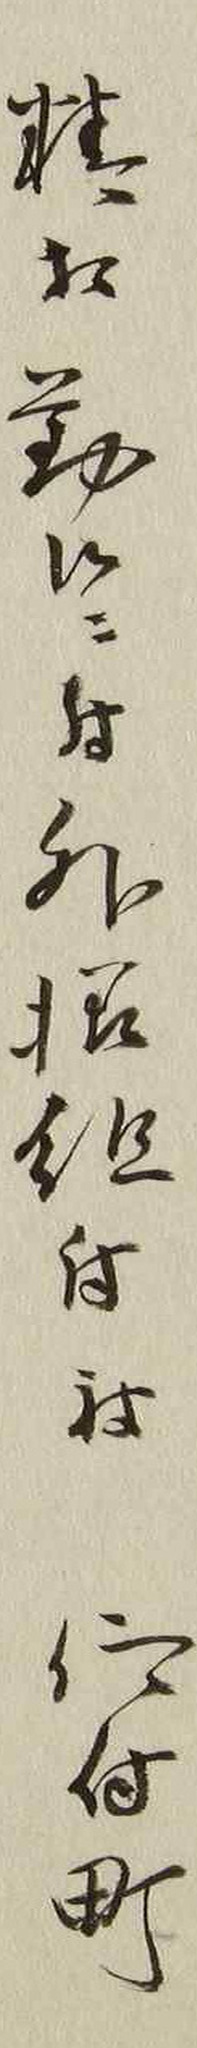精相勤候ニ付外様組付被仰付町
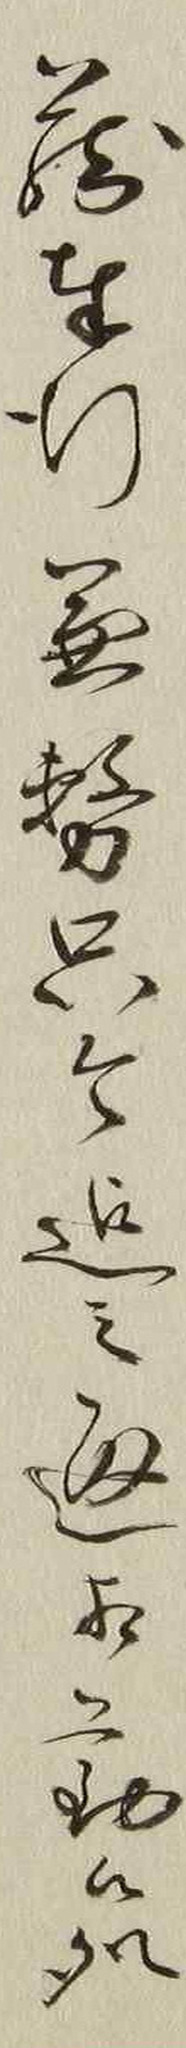蔵奉行兼務只今迄之通相勤候処
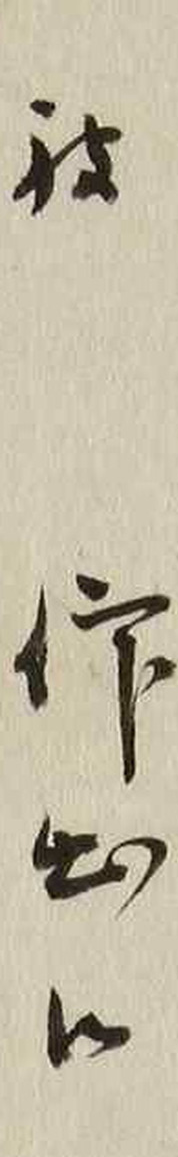被仰出候
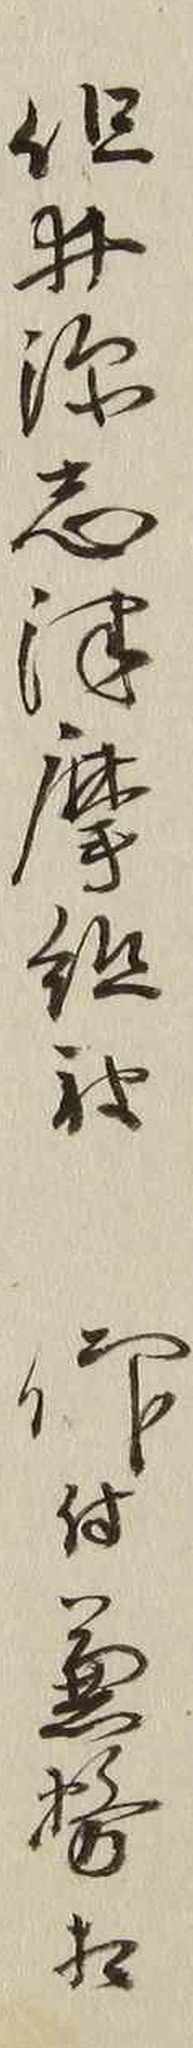但井深志津摩組被仰付兼務相
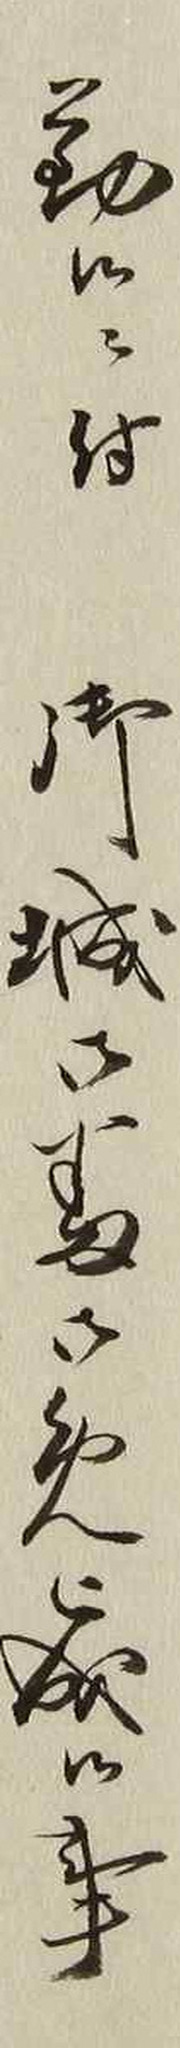勤候ニ付御城御番御免被成候事
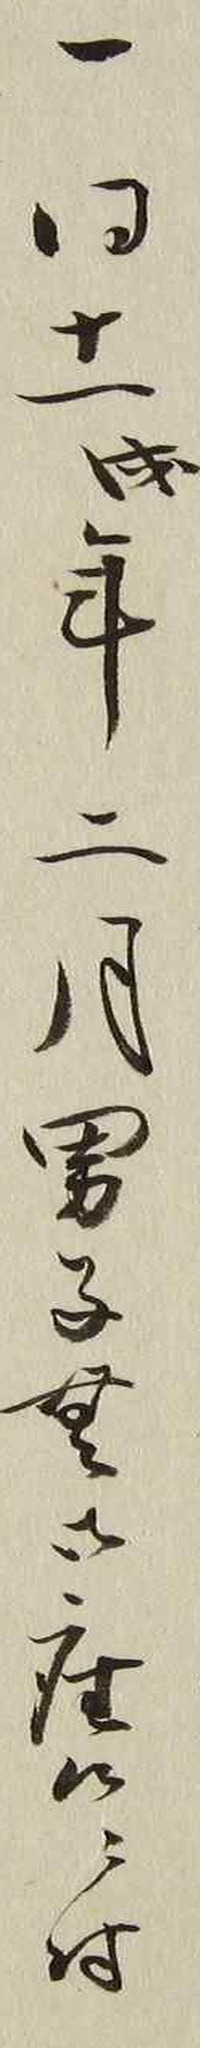一同十一戌年二月男子無御座候ニ付
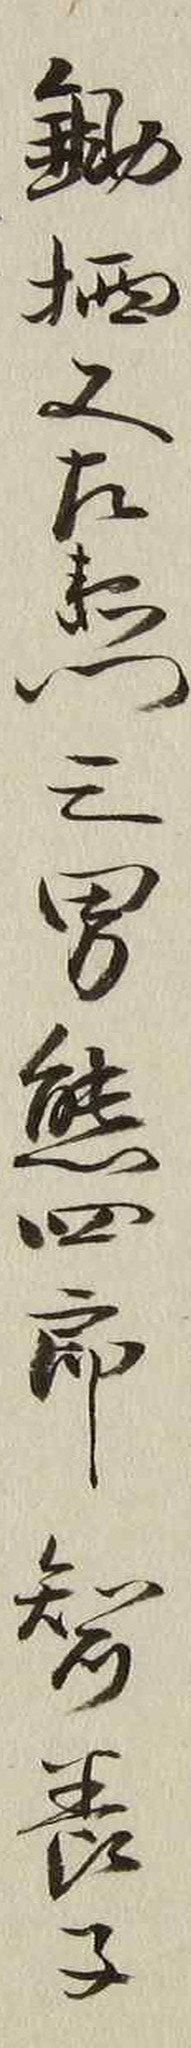鋤栖又左衛門三男熊四郎聟養子
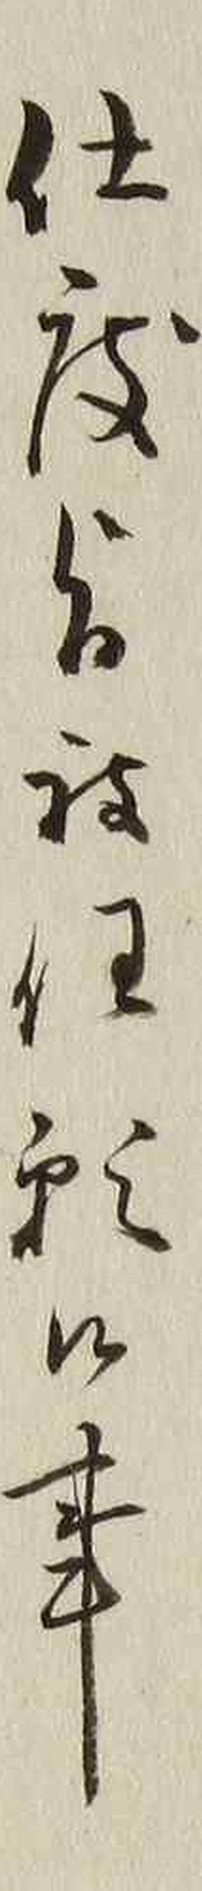仕度旨被任願候事
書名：諸士系譜　巻之163　な之部5
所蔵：会津若松市立会津図書館
